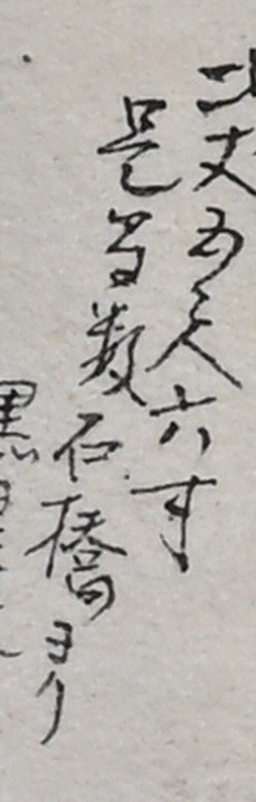是間数石橋ヨリ西

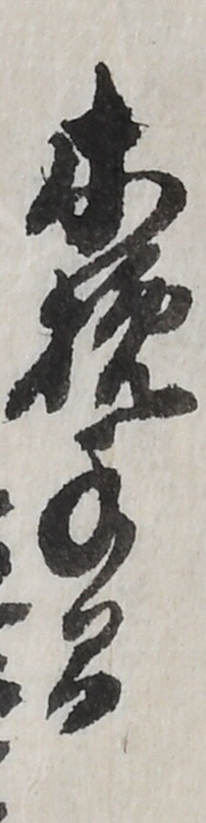木挽手間
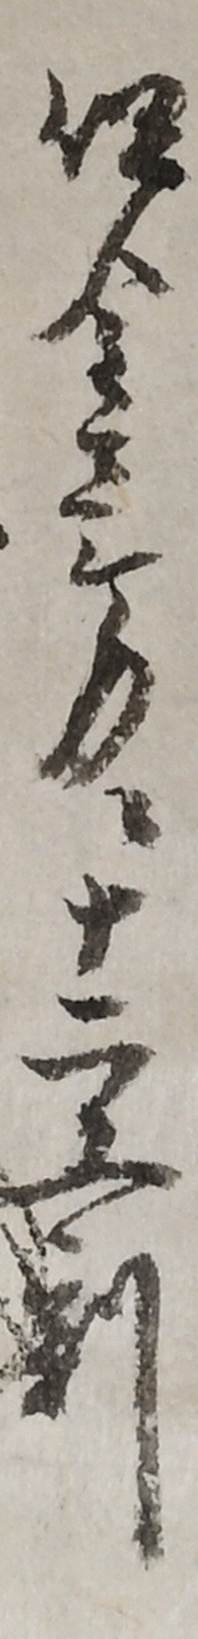但金壱分ニ十二工割
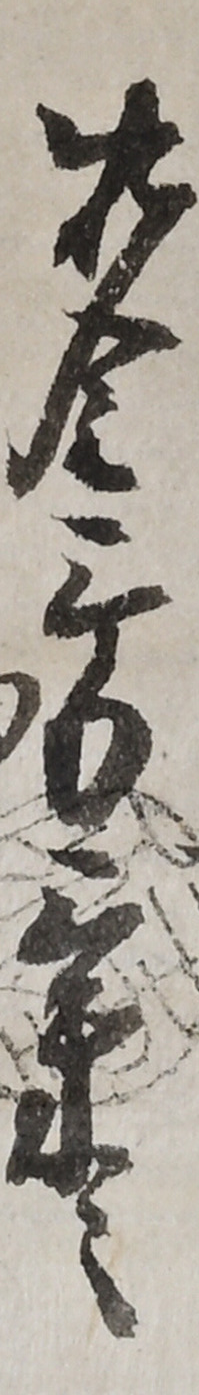此金三分三朱ニ
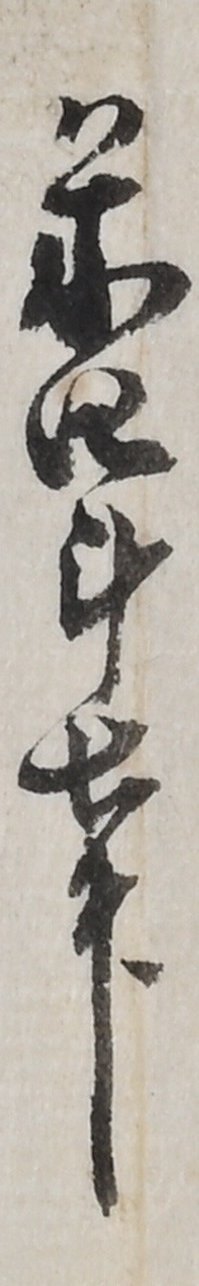米四斗七升
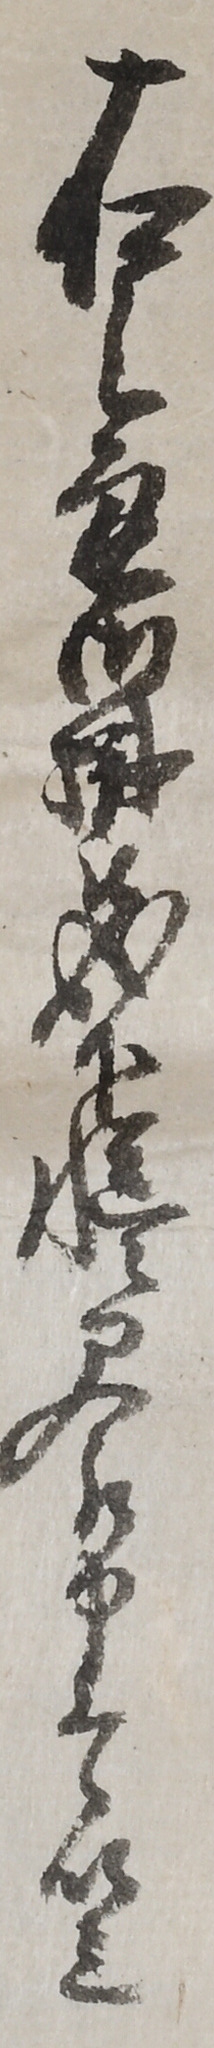右之通御払被成下慥ニ受取申上候以上

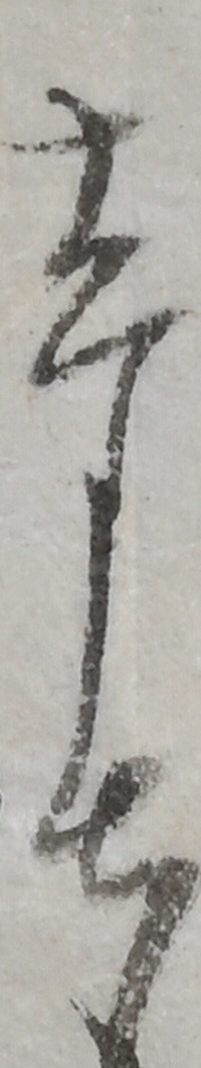十二月七日
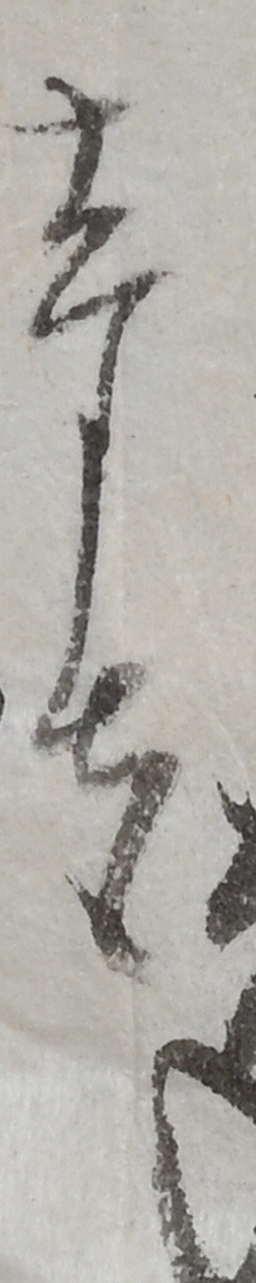十二月七日
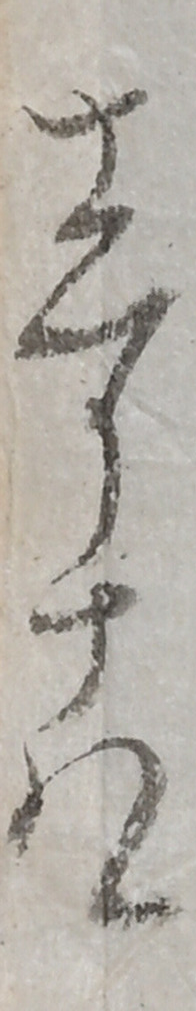十二月十八日
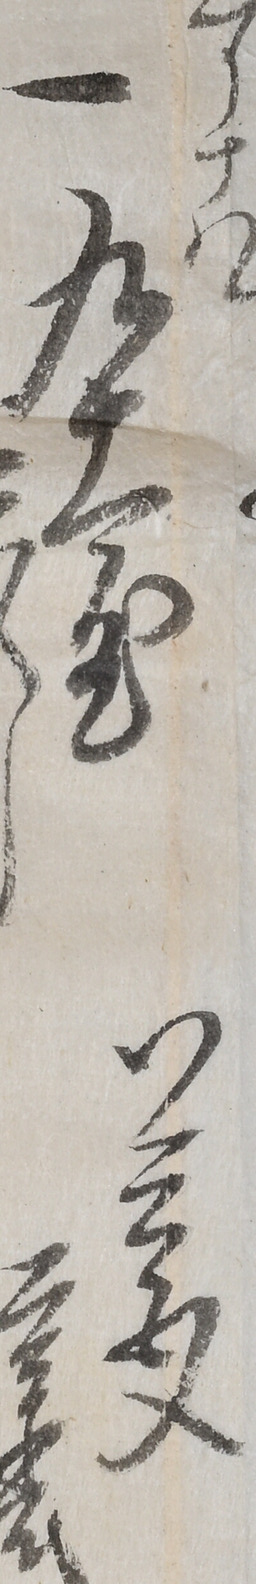一九十一匁同三五入
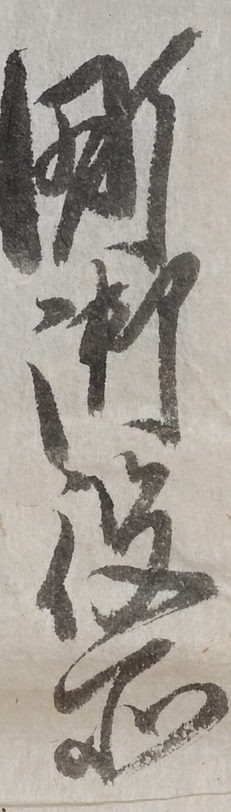町御役所

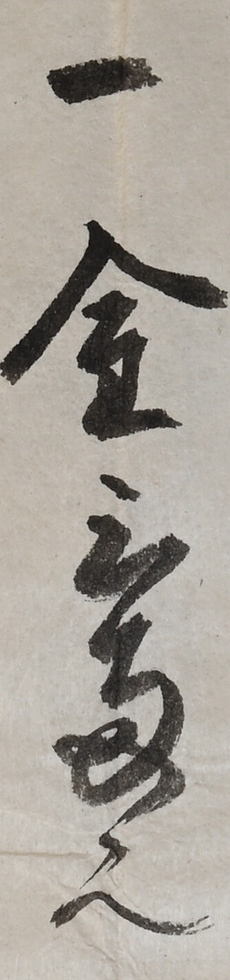一金三両也
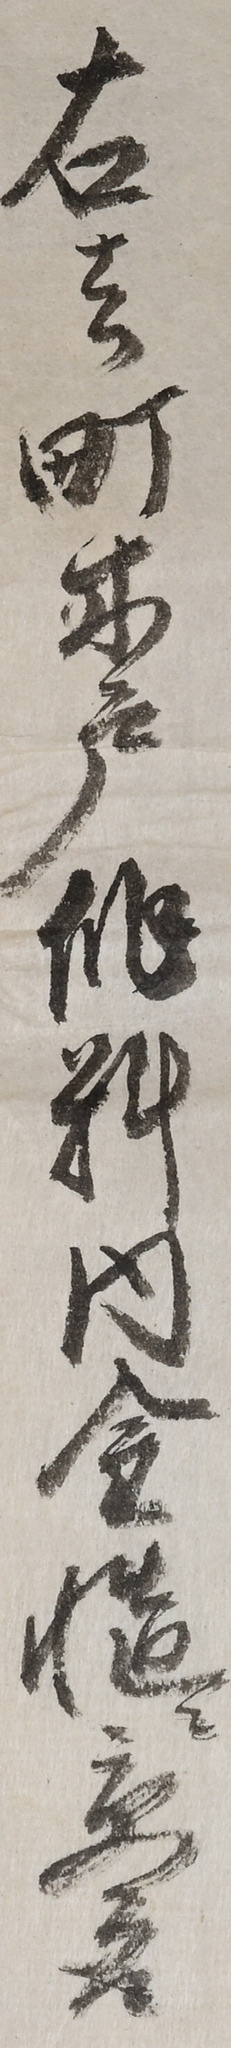右は町木戸作料内金慥ニ受取
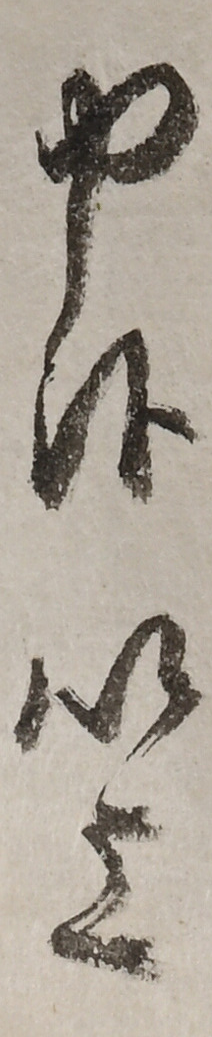申候以上
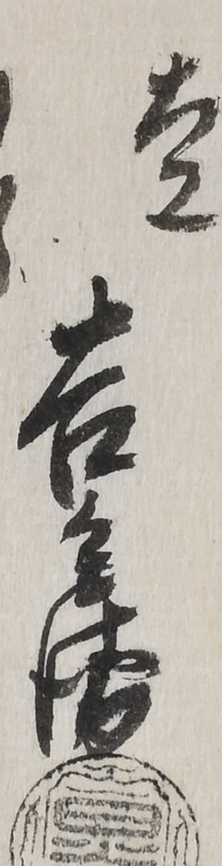吉兵衛
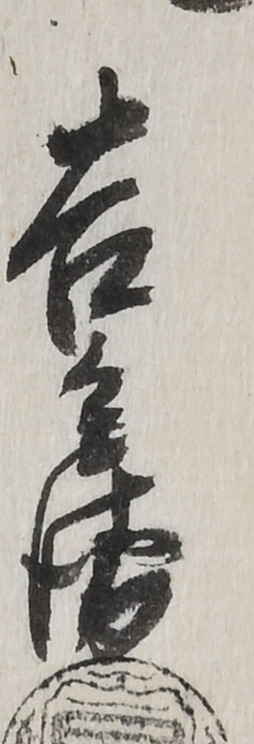吉兵衛
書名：町方木戸御普請諸事附（一括）
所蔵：伊那市立高遠町図書館・合同会社AMANE
